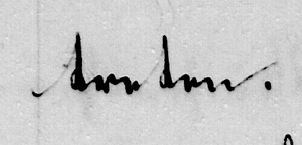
treten.
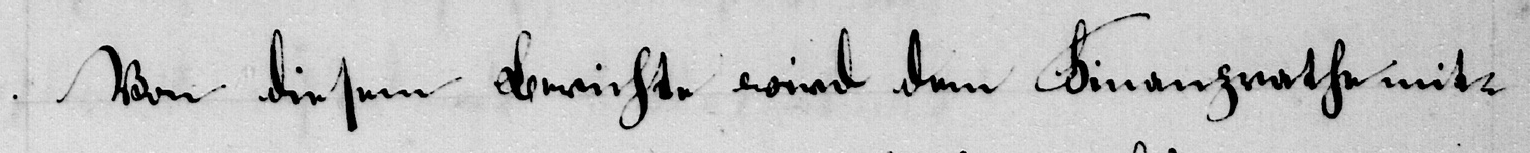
Von diesem Berichte wird dem Finanzrathe mit¬
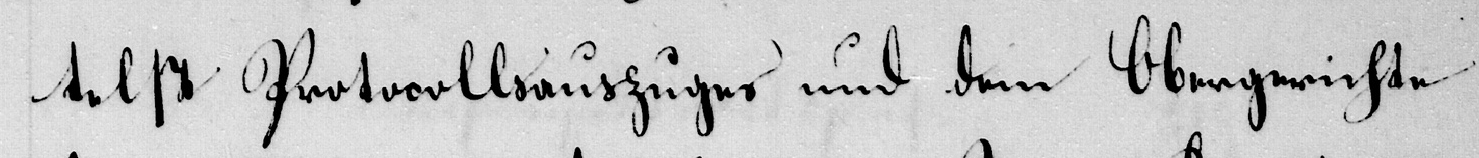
telst Protocollsauszuges und dem Obergerichte
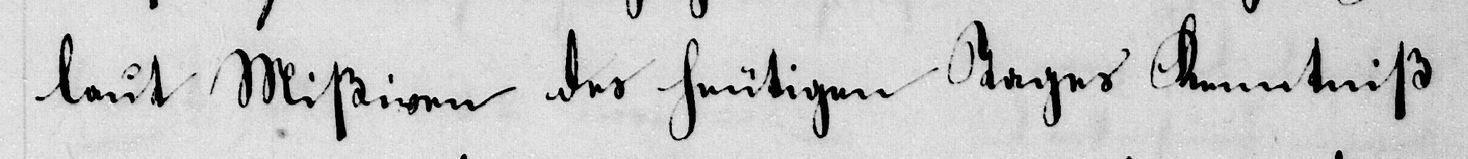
laut Mißiven des heutigen Tages Kenntniß
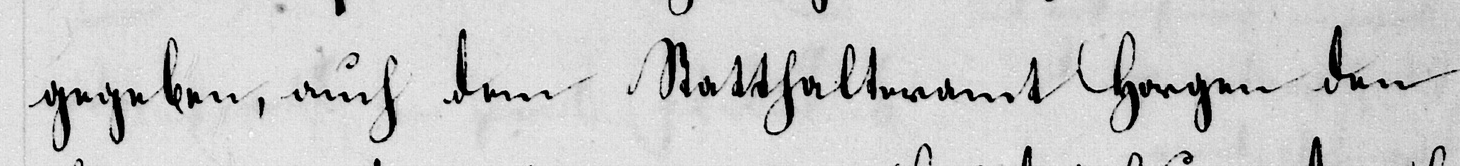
gegeben, auch dem Statthalteramt Horgen den
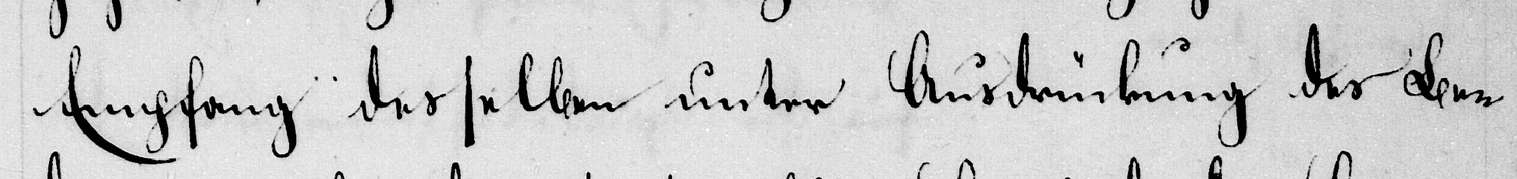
Empfang desselben unter Ausdrückung des Be¬
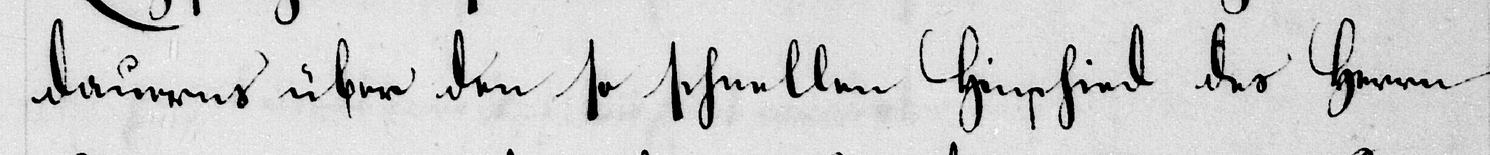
dauerns über den so schnellen Hinschied des Herrn
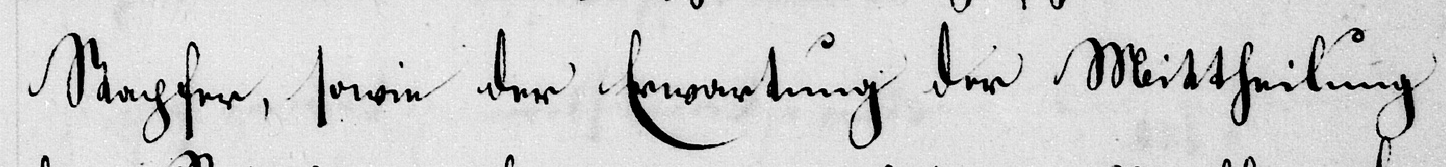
Stapfer, sowie der Erwartung der Mittheilung
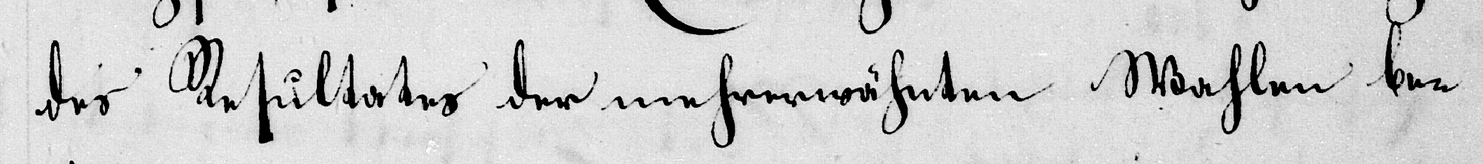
des Resultates der mehrerwähnten Wahlen be¬
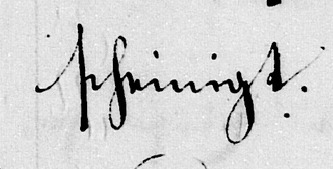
scheinigt.
